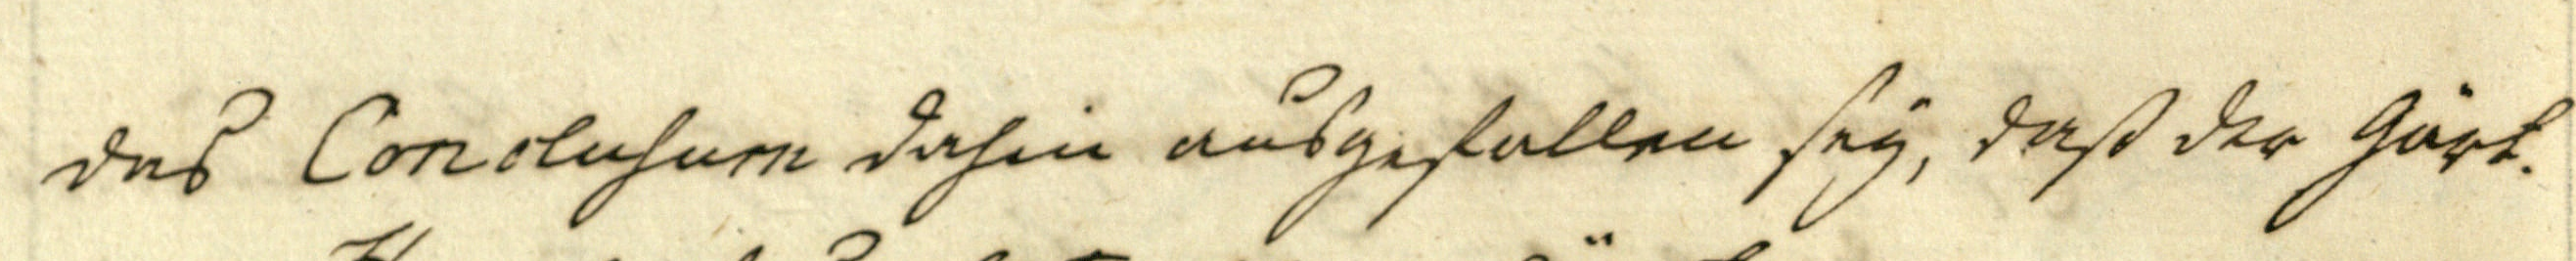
das Conclusum dahin ausgefallen seÿ, daß der Gärt¬
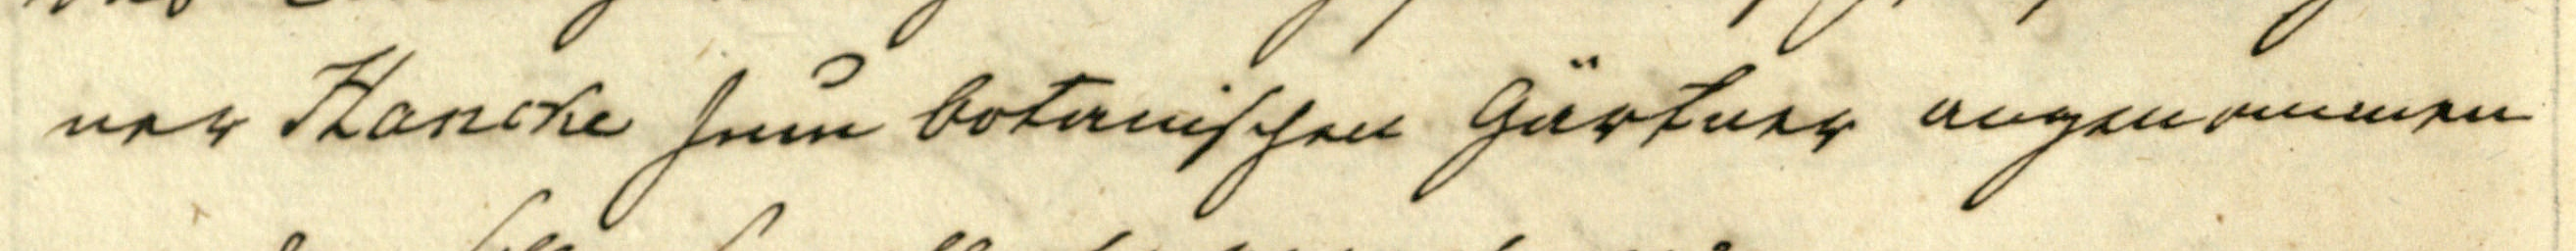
ner Hancke zum botanischen Gärtner angenommen
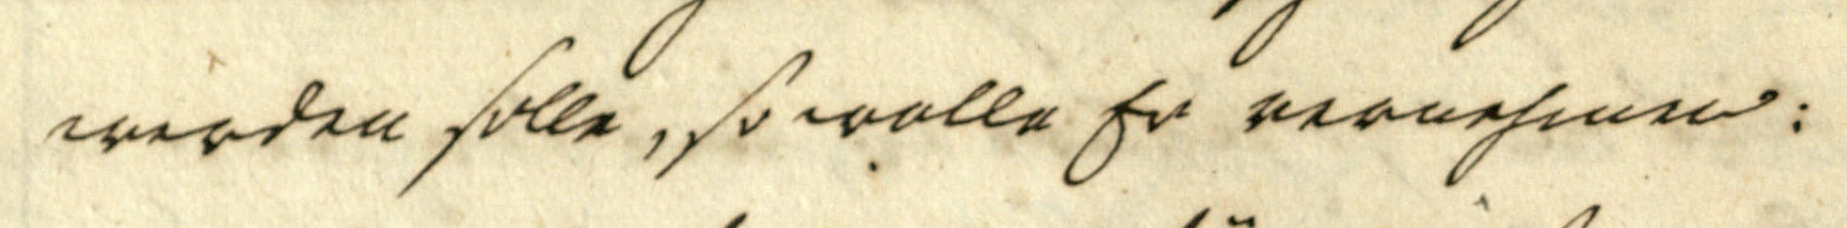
werden solle, so wolle Er vernehmen:
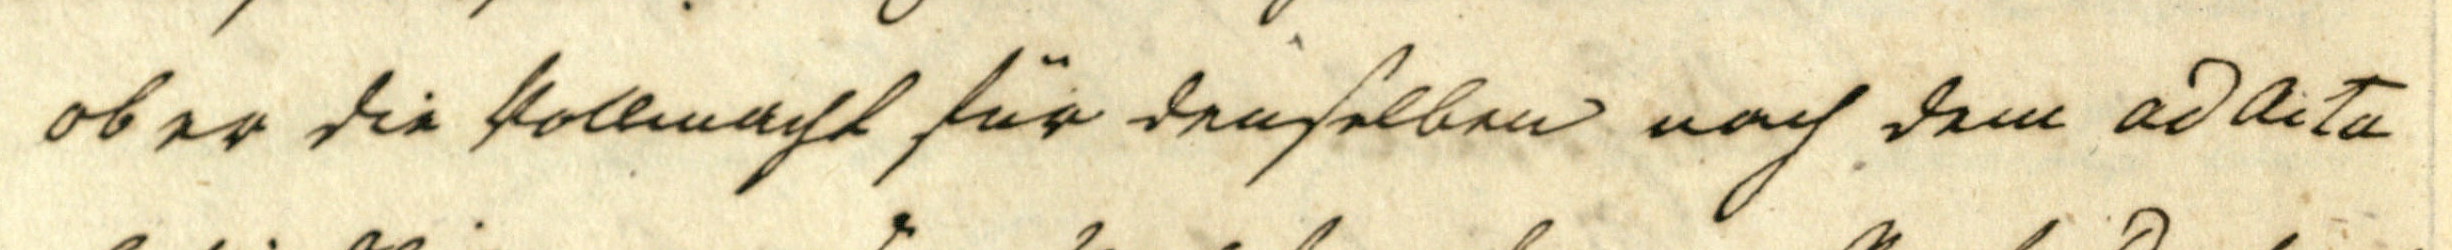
ob er die Vollmacht für denselben nach dem ad Acta
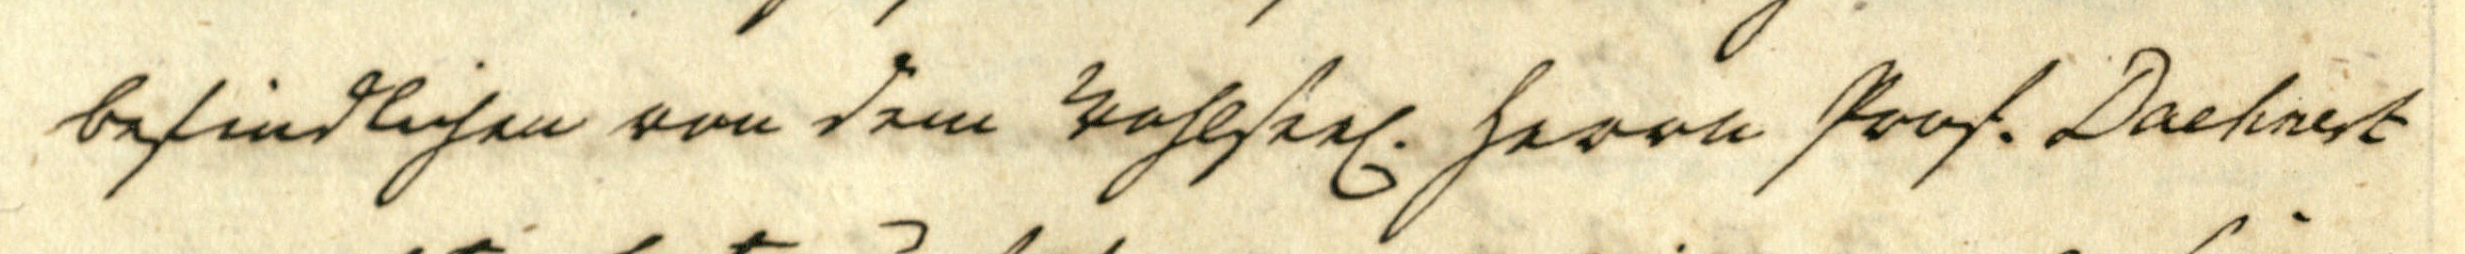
befindlichen von dem Wohlseel. Herrn Prof. Daehnert
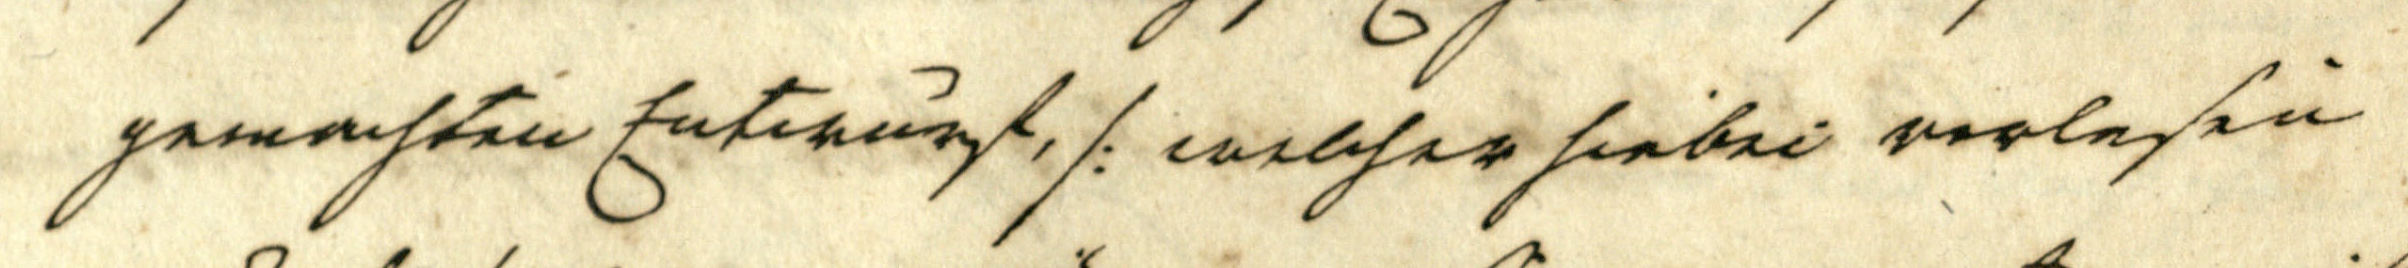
gemachten Entwurf, /: welcher hiebei verlesen
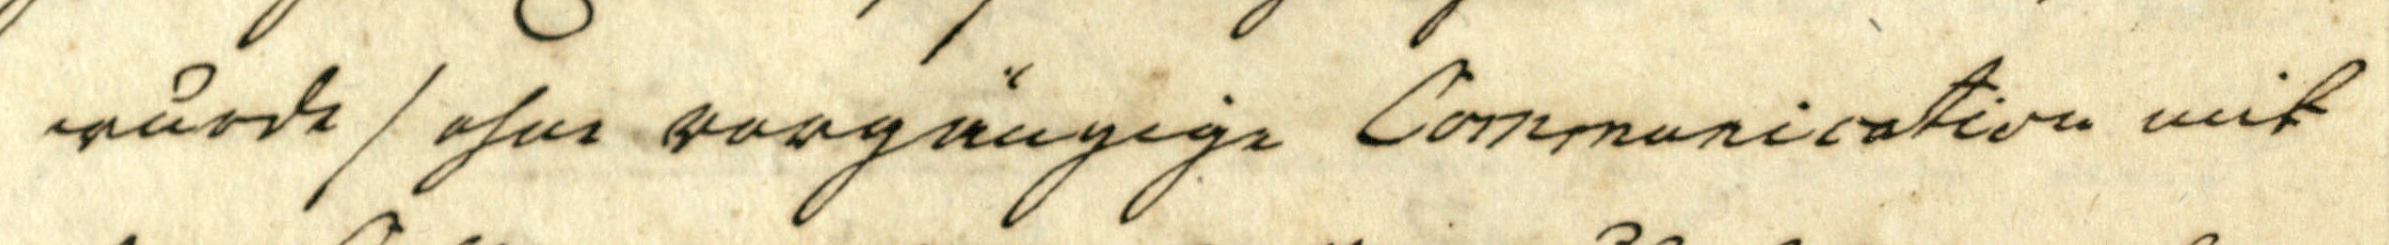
wurde / ohne vorgängige Communication mit
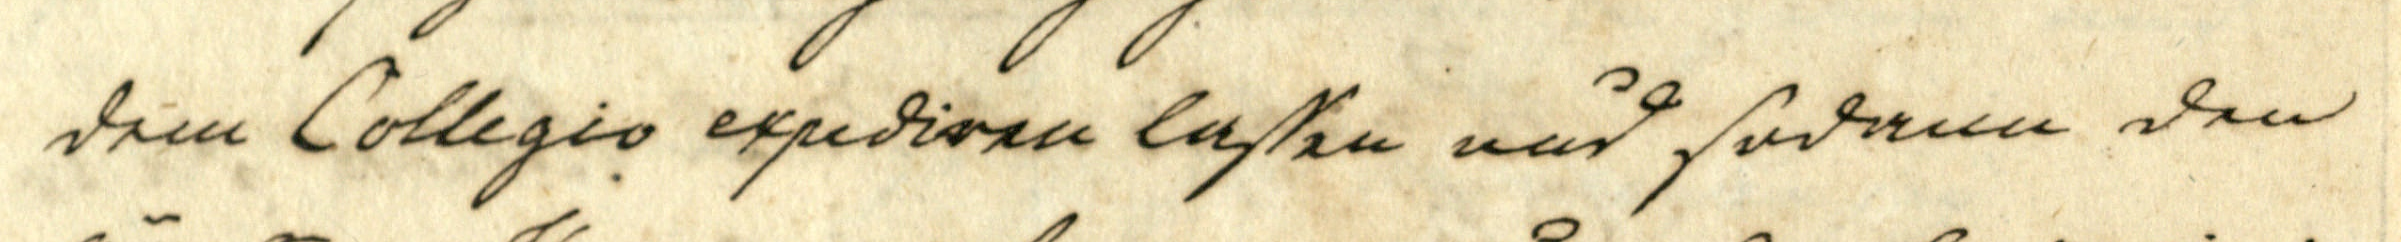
dem Collegio expediren lassen und sodann den
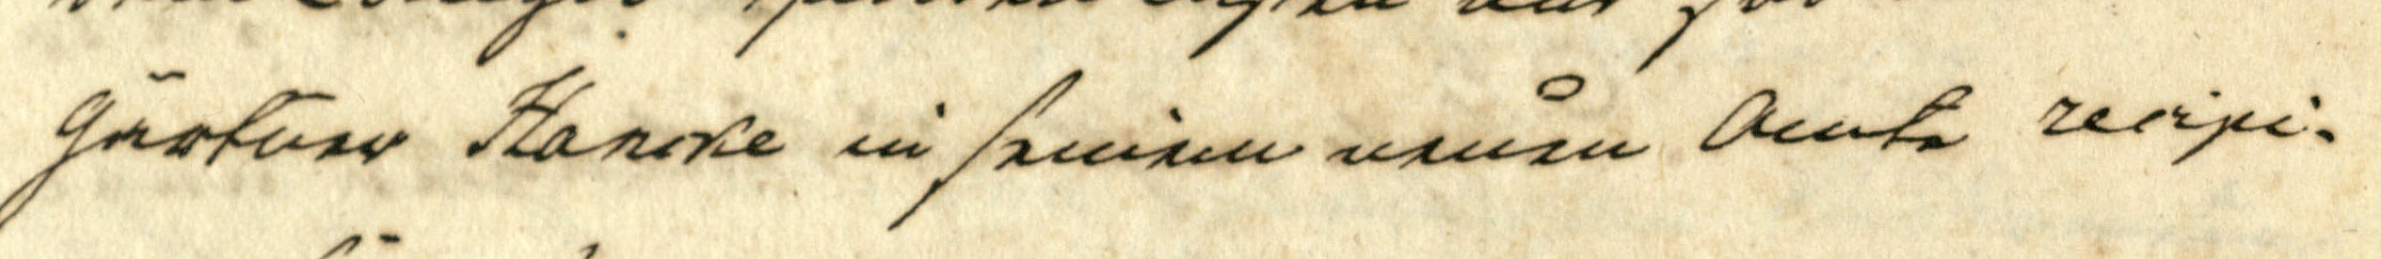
Gärtner Hancke in seinem neuen Amte racipi¬
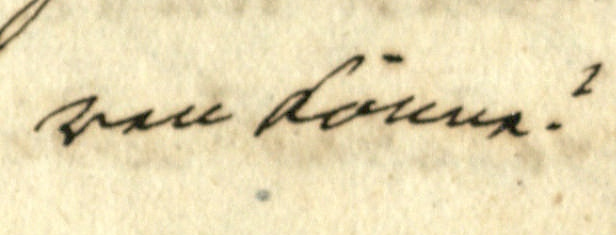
ren könne.
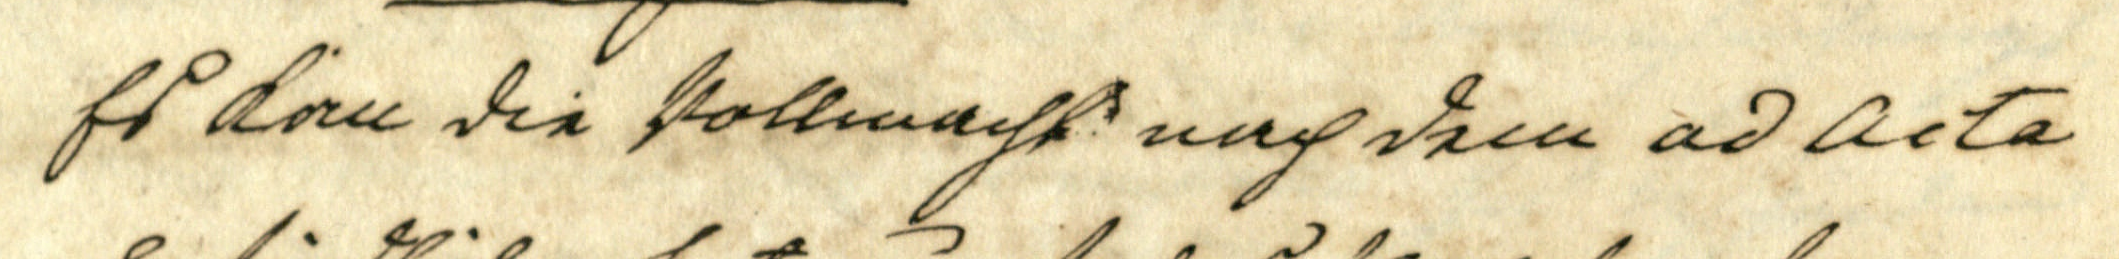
Es kan die Vollmacht nach dem ad Acta
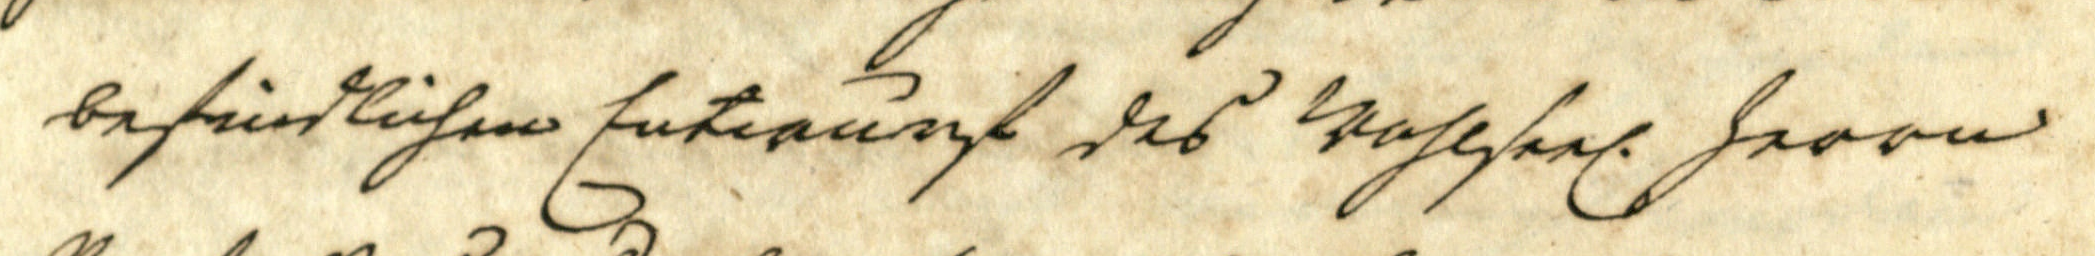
befindlichen Entwurf des Wohlseel. Herrn
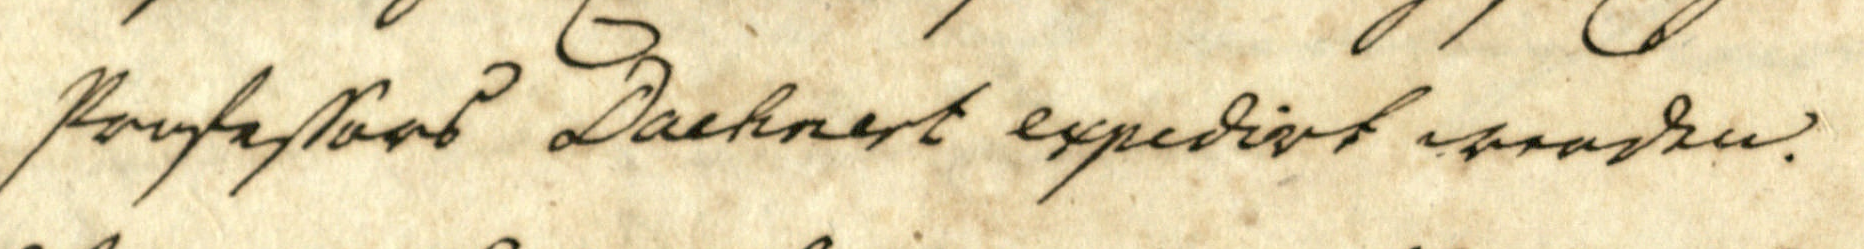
Professors Daehnert expedirt werden.
